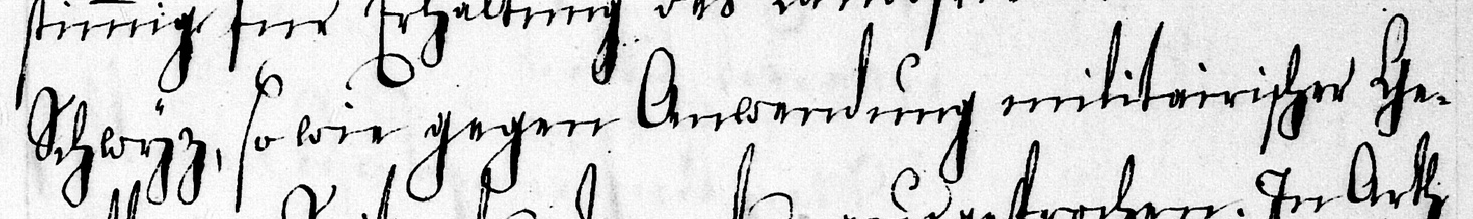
Schwyz, sowie gegen Anwendung militairischer Ge¬
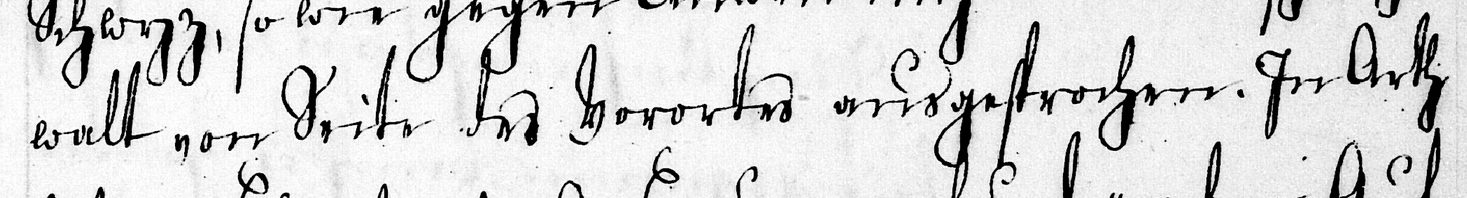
walt von Seite des Vorortes ausgesprochen. In Arth
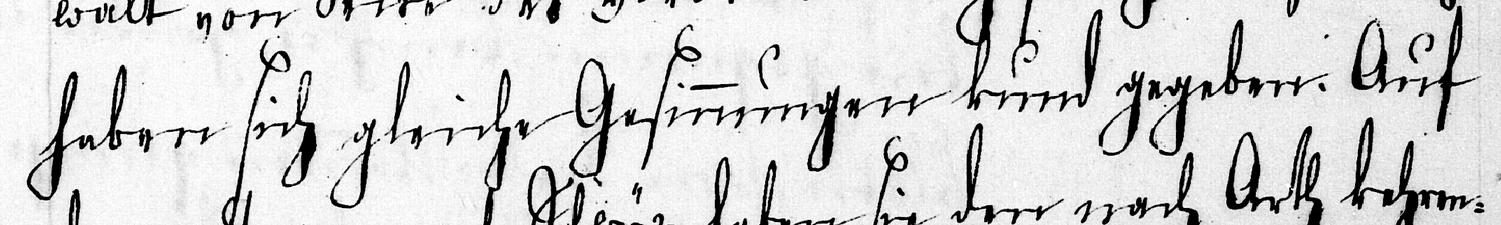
haben sich gleiche Gesinnungen kund gegeben. Auf
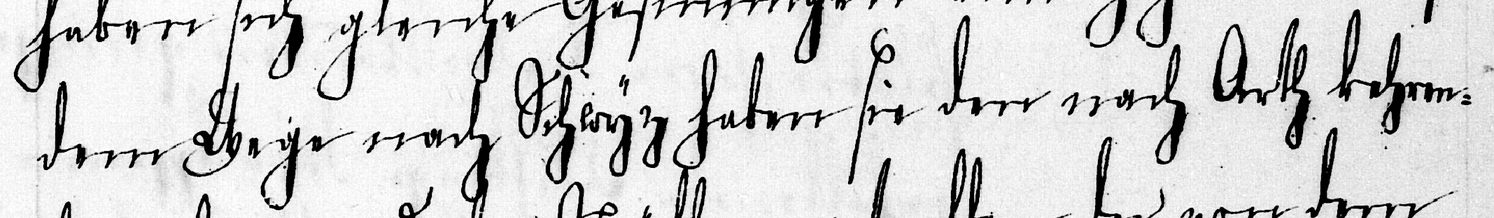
dem Wege nach Schwyz haben sie den nach Arth kehren¬
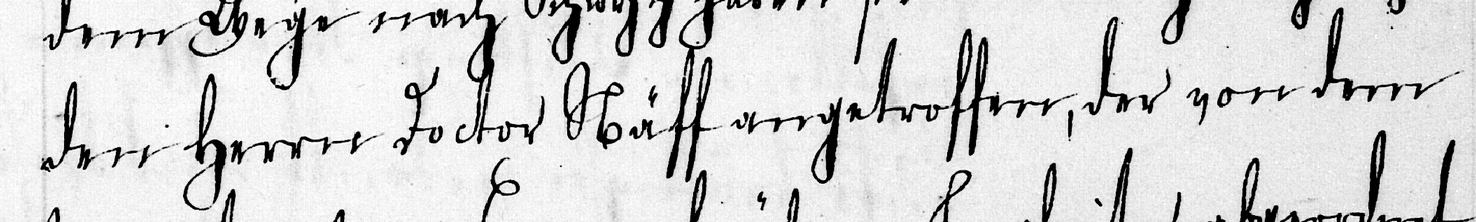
den Herrn Doctor Näff angetroffen, der von dem
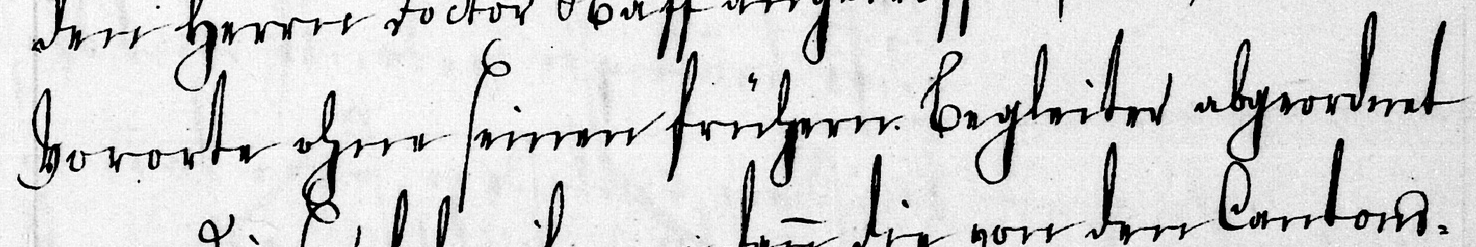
Vororte ohne seinen frühern Begleiter abgeordnet
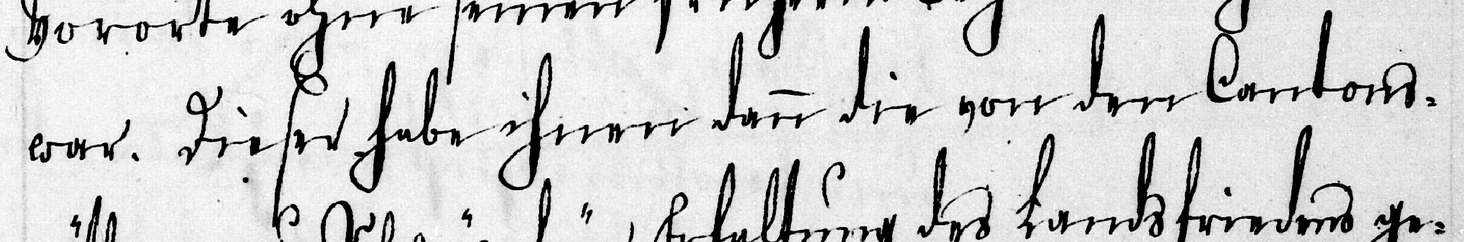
war. Dieser habe ihnen dann die von den Cantons¬
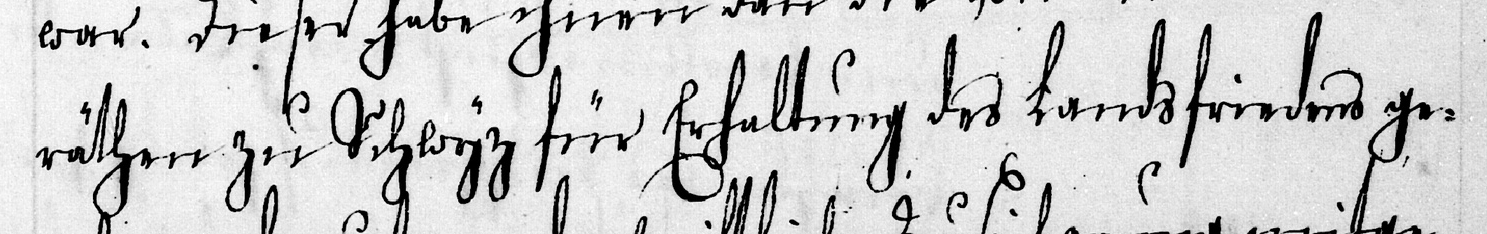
räthen zu Schwyz für Erhaltung des Landsfriedens ge¬
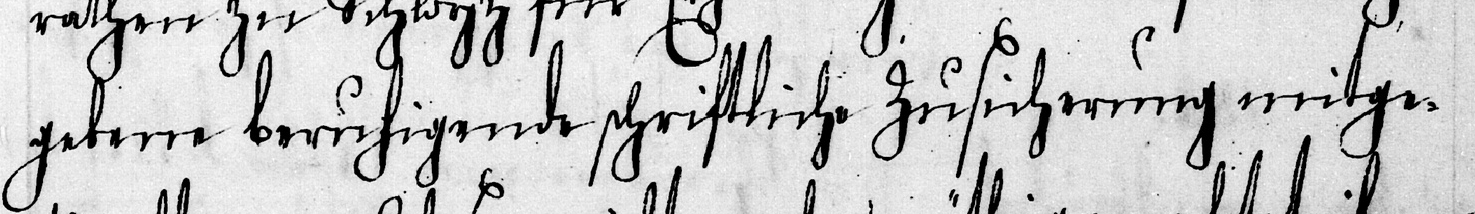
gebene beruhigende schriftliche Zusicherung mitge¬
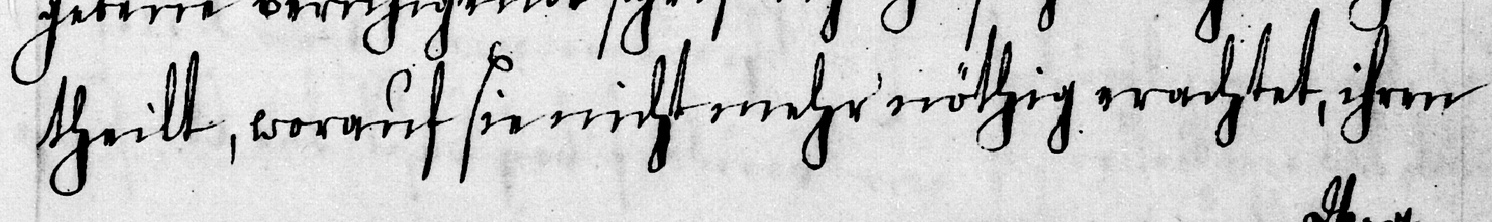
theilt, worauf sie nicht mehr nöthig erachtet, ihren
